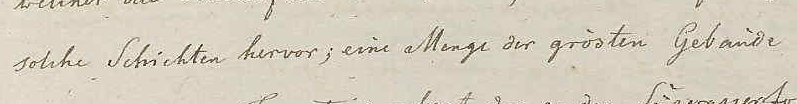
solche Schichten hervor; eine Menge der grösten Gebäude
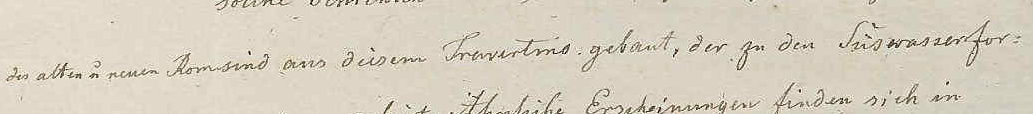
des alten u neuen Rom sind aus diesem Travertino gebaut, der zu den Süswasserfor-
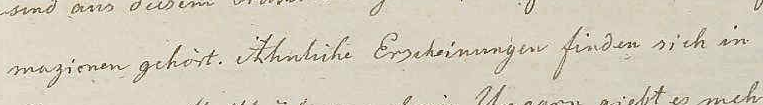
mazionen gehört. Ähnliche Erscheinungen finden sich in
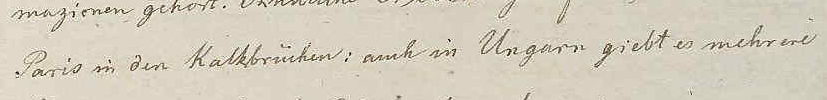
Paris in den Kalkbrüchen: auch in Ungarn giebt es mehrere
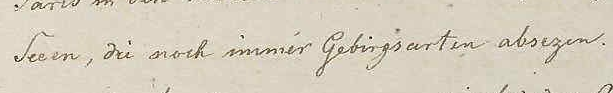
Seeen, die noch immer Gebirgsarten absezen.
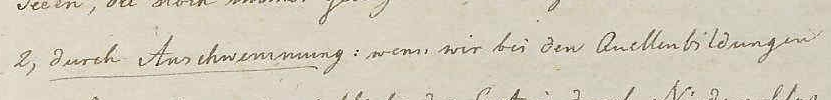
2, durch Anschwemmung: wenn wir bei den Quellenbildungen
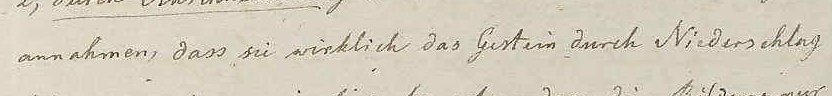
annahmen, dass sie wirklich das Gestein durch Niederschlag
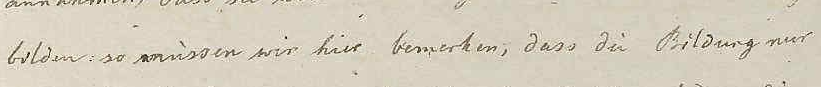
bilden: so wmüssen wir hier bemerken, dass die Bildung nur
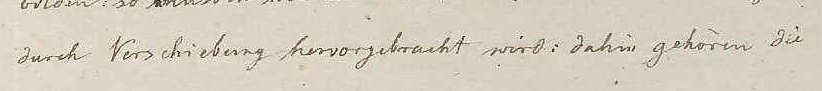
durch Verschiebung hervorgebracht wird: dahin gehören die
